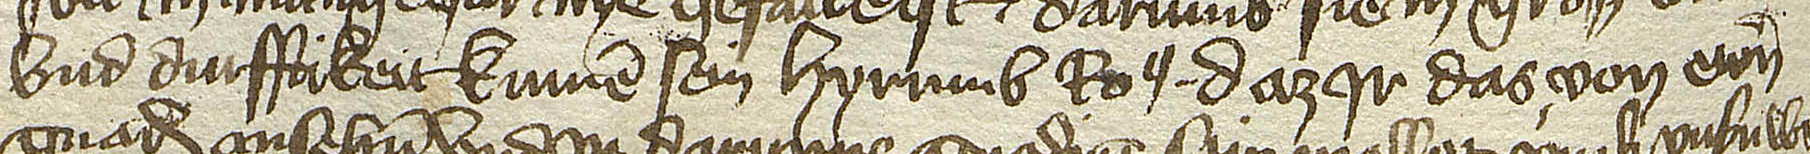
vnd durfftikeit kume* ſein Hyrumb Ro* . daʒ Ir das von ew*n
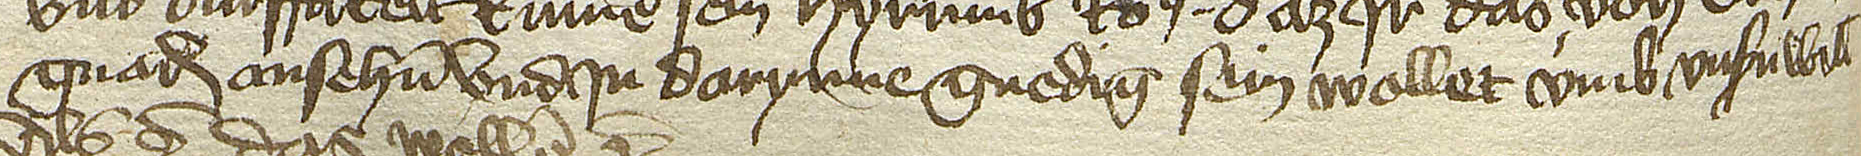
gnad* anſeh*n vnd In darynne gnedig ſein wollet v̈mb vnſ*n will*
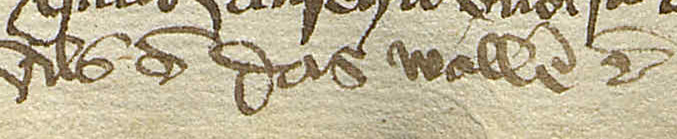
Als ec* das wölle* ec*
